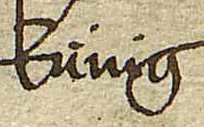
Künig
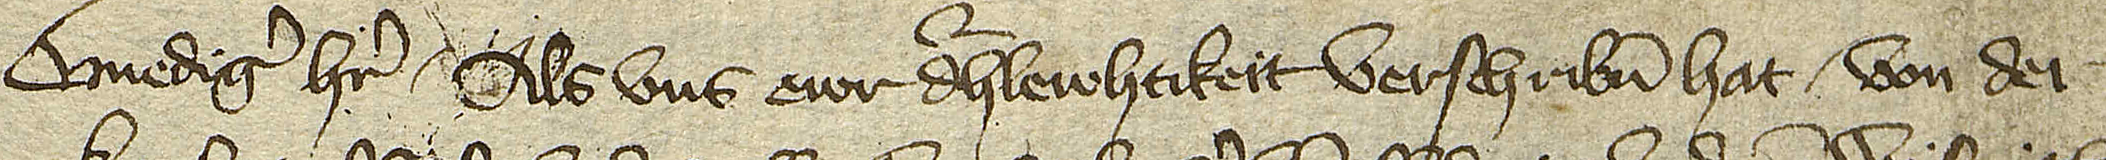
Gnedig* hr* / Als vns ewr d*hlewhtikeit verſchribn* hat / von der
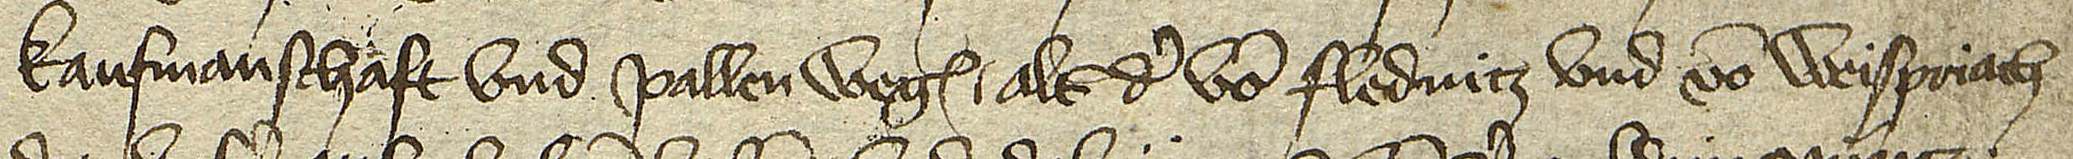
kaufmanſchaft vnd pallen weg* / als d* vo* flednicʒ vnd vo* weiſpriach
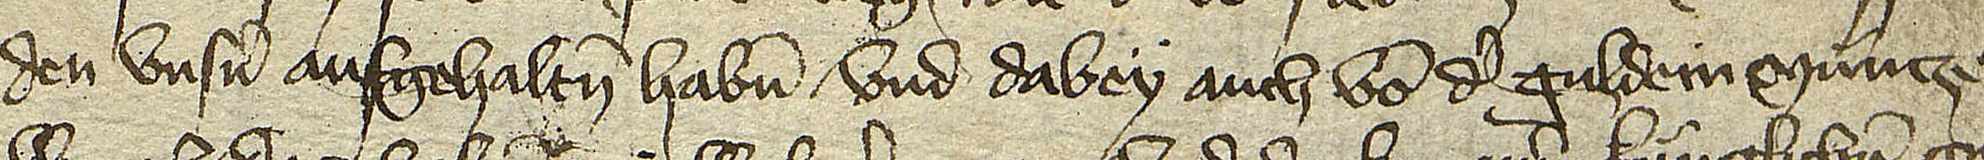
den vnſn* aufgehaltn* habn* / vnd dabey auch vo* d* guldein Müncʒe
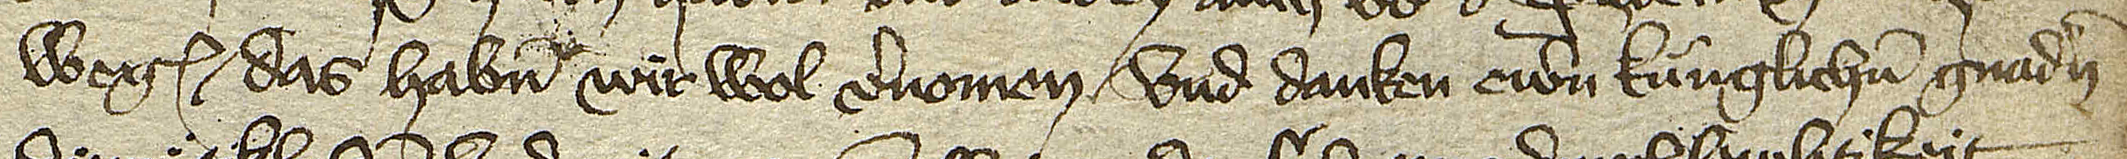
weg* / das habn* wir wol v*nomen / vnd danken ewn* künglichn* gnadn*
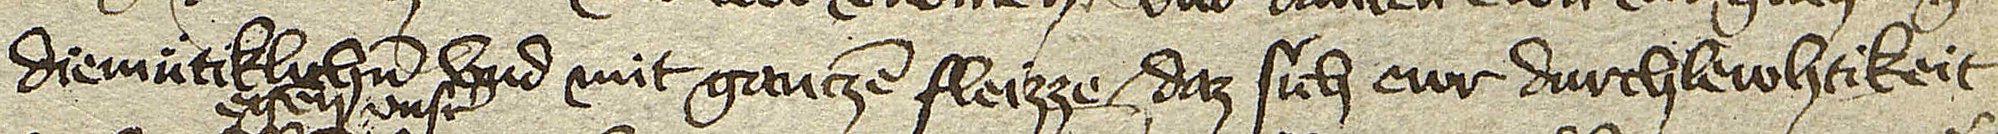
diemütiklichn* vnd mit gancʒe* fleiʒʒe / daʒ ſich ewr durchlewhtikeit
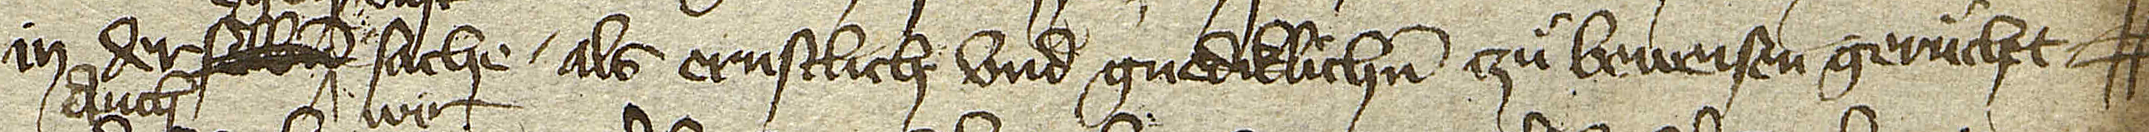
in der ſelbn* ſache / als ernſtlich vnd gnediklichn* cʒü beweiſen gerüchet
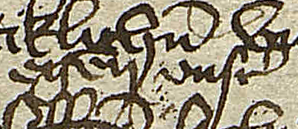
egen* vnſr*
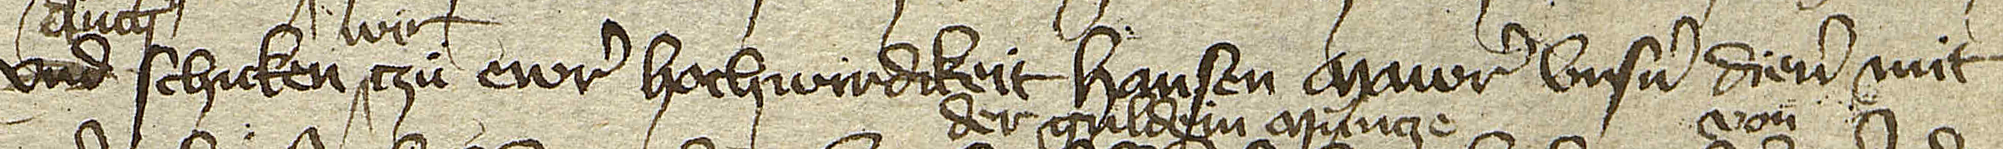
vnd ſchicken cʒü ewr* hochwirdikeit hanſen Mawr* vnſ*n dien* mit
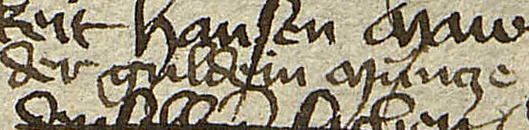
der guldein Müncʒe
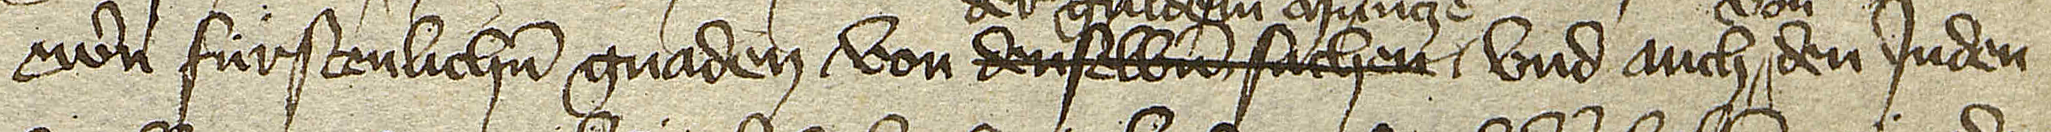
ew*n fürſtenlichn* gnaden / von denſelbn* ſachen / vnd auch den Iuden
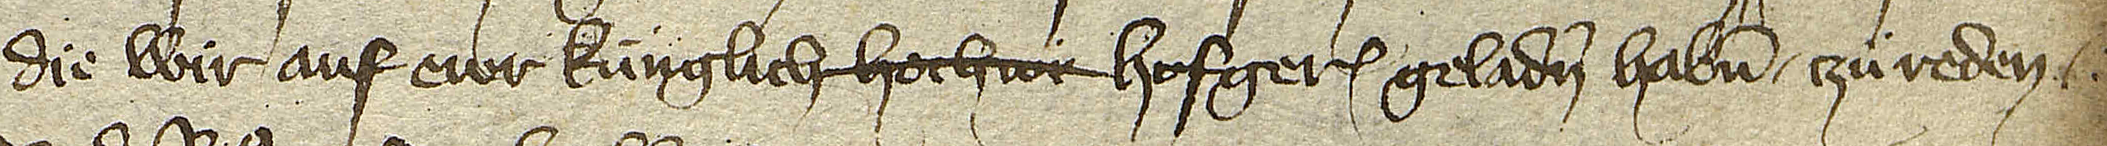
die wir auf ewr künglich hochwi hofger* geladn* habn* / cʒü reden /
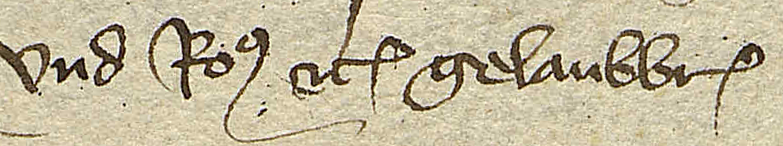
vnd Ro* ec* gelaubbr*
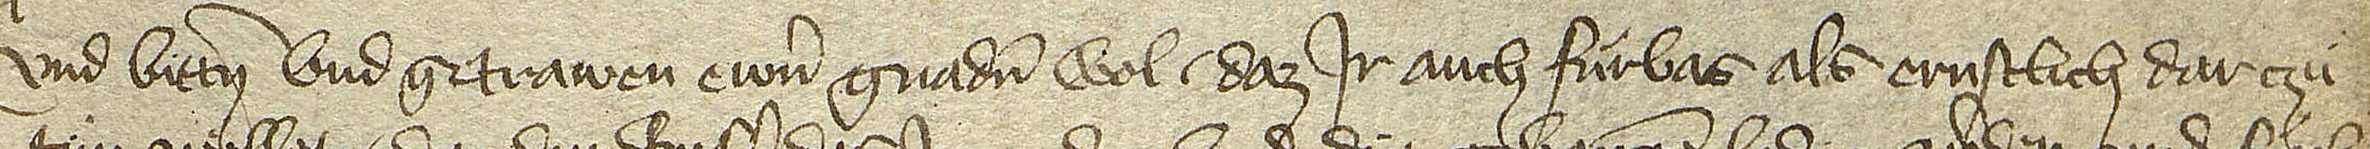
vnd bittn* vnd getrawen ewn* gnadn* wol / daʒ Ir auch fürbas als ernſtlich dar cʒü
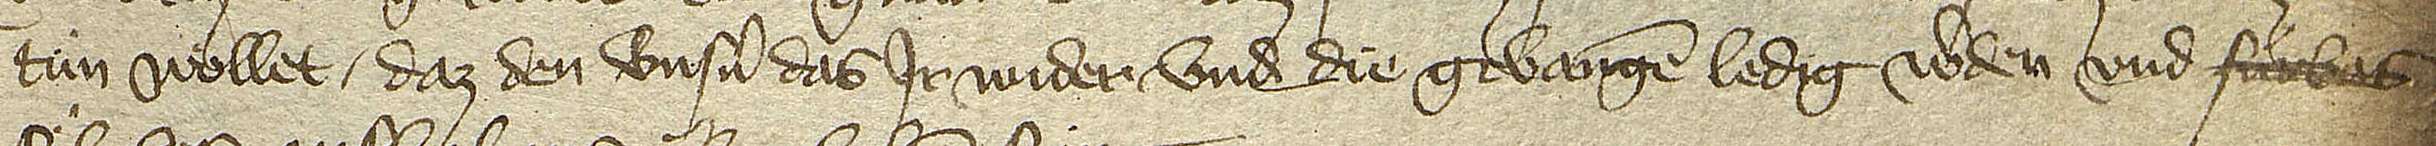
tün wöllet / daʒ den vnſn* das Ir wider / vnd die gevange* ledig w*den vnd fürbas
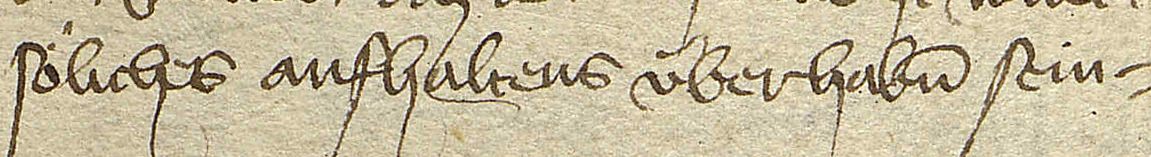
ſöliches aufhaltens berhabn* ſein
